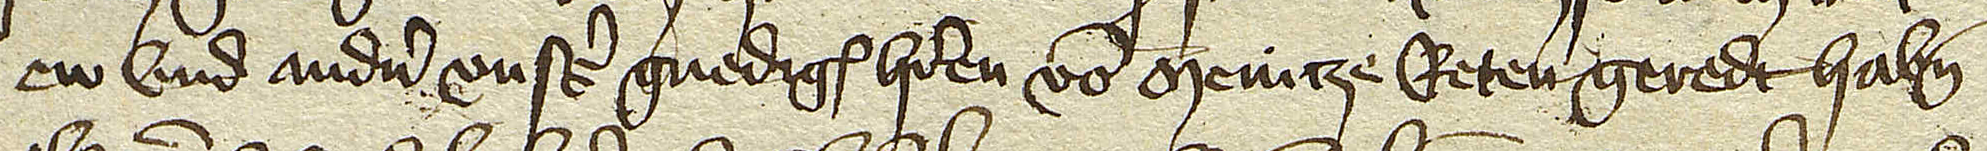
ew vnd andn* vnſs* gnedig* hr*en vo* Meincʒe Reten geredt habn*
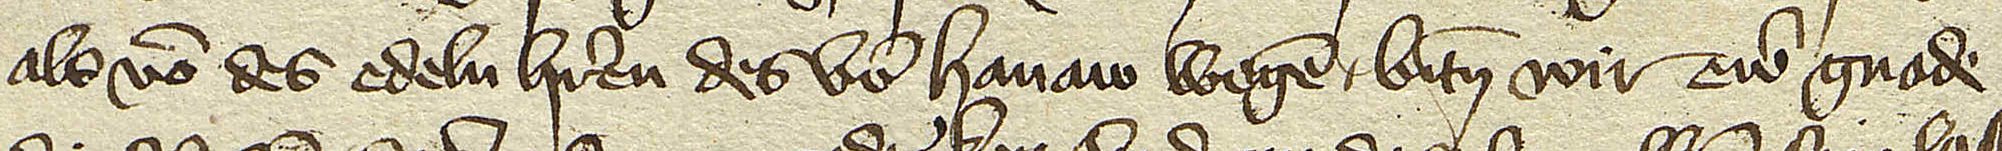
als vo* des edeln hr*en des vo* Hanaw wege* / bitn* wir ew* gnade
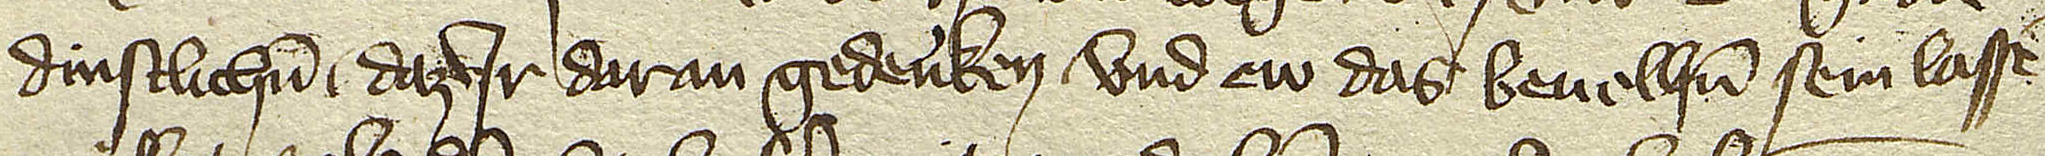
dinſtlichn* / daʒ Ir daran gedenken / vnd ew das beuolhn* ſein laſſe*
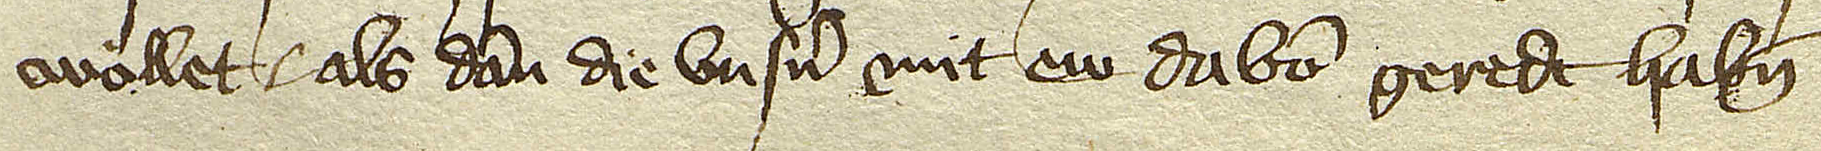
wöllet / als dan* die vnſn* mit ew davo* geredt habn*
